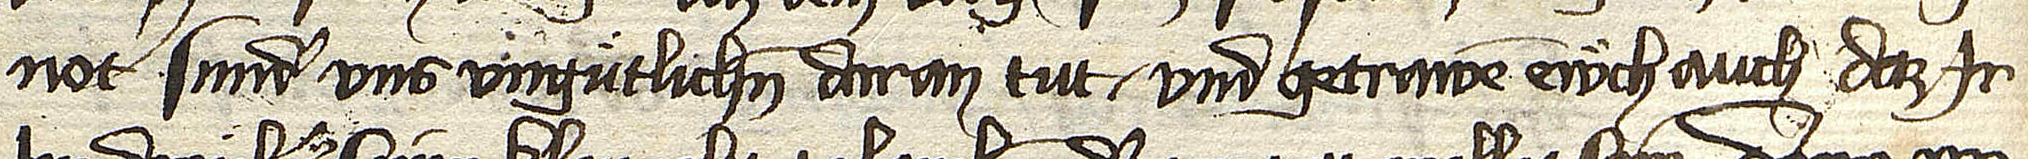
not ſund* vns vngütlichn* daran tut / vnd getrawe* eẅch auch daʒ Ir
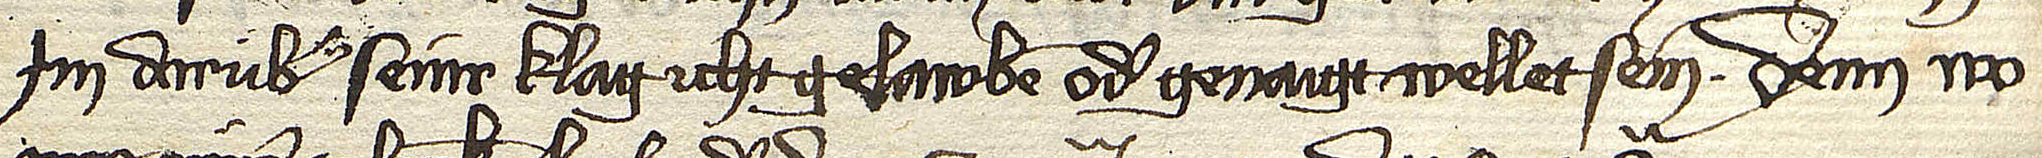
Im darüb* ſeinr klag icht gelawbe* od* genaigt wellet ſein . Denn wo
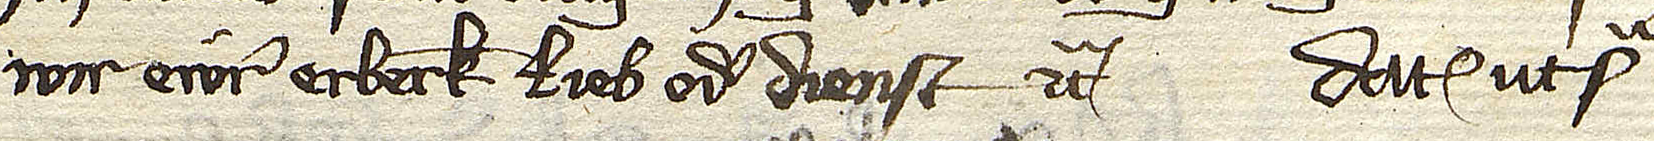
wir eẅr* erberk* lieb od* dienſt ec* Dat* ut ſ*
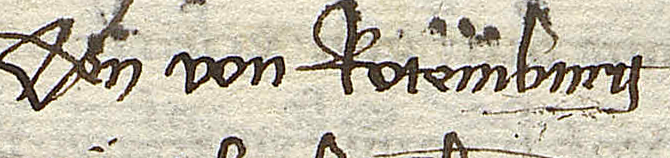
Den von Rotemburg
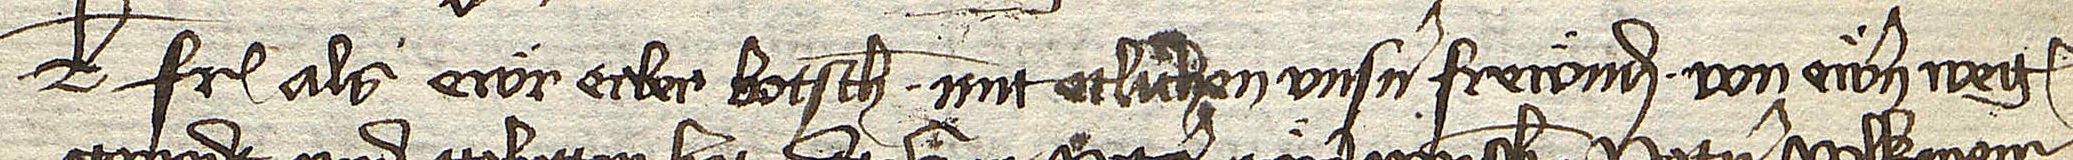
L* fr* als eẅr erber botſch* . mit etlichen vnſn* freẅnd* . von eẅ*n weg*
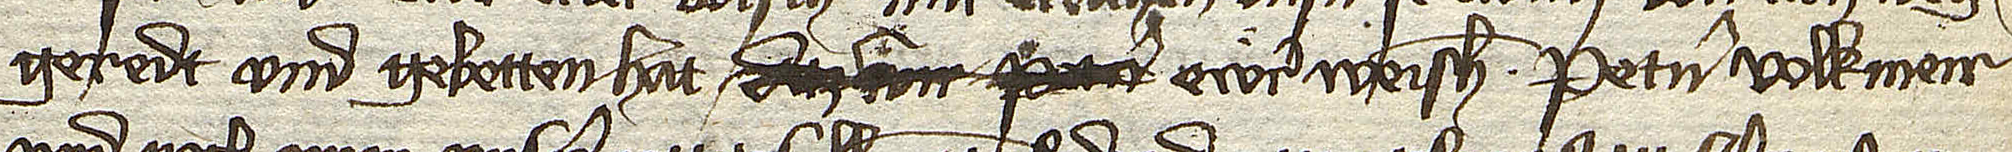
geredt vnd gebetten hat / daʒ wir Petn* eẅr* weiſh* . Petn* volkmeir
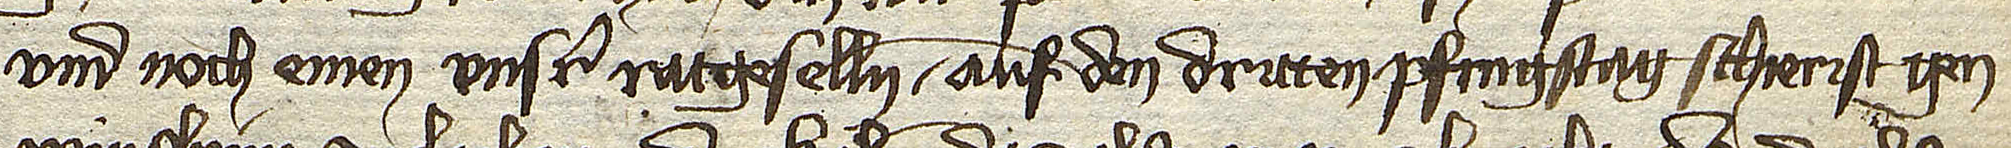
vnd noch einen vnſr* ratgeſelln* / auf den dritten pfingſtag ſchieriſt gen
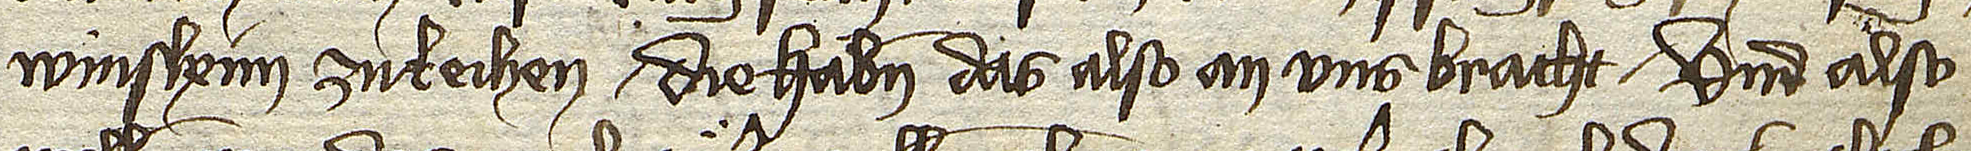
winſheim ʒuleihen / Die habn* das alſo an vns bracht / Vnd alſo
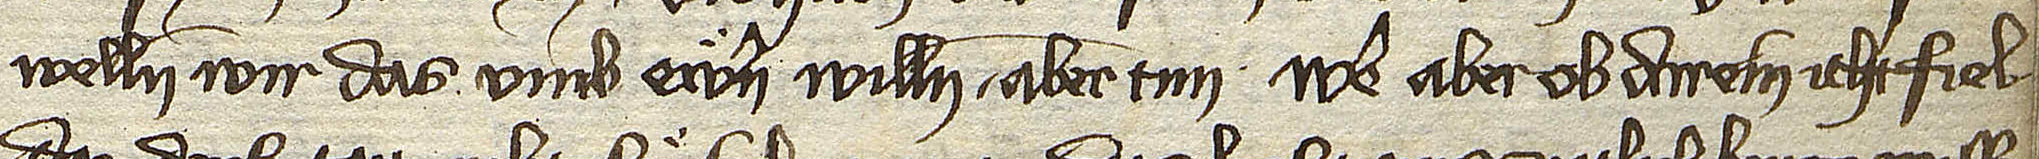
welln* wir das vmb eẅ*n willn* / aber tun . w*e aber ob darein icht fiel
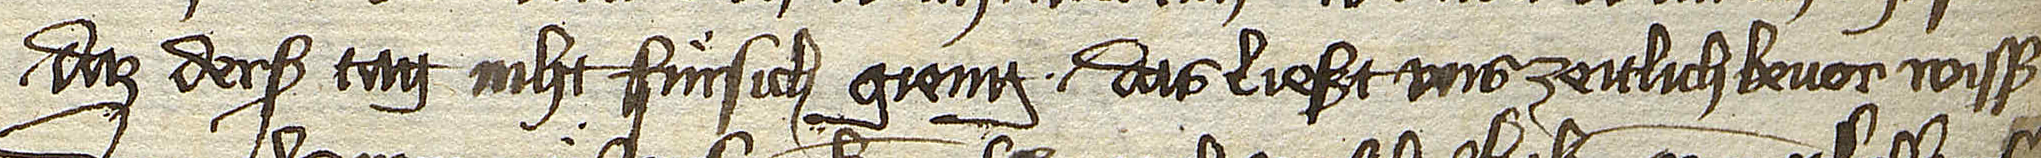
/ daʒ derſ* tag niht fürſich gieng . / das lieſʒt vns ʒeitlich beuor wiſſ*
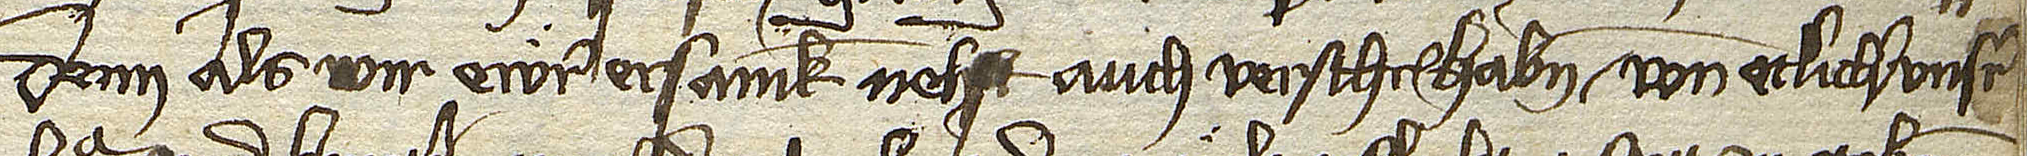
Denn als wir eẅr* erſamk* nehſt auch verſchr* habn* / von etlich* vnſr*
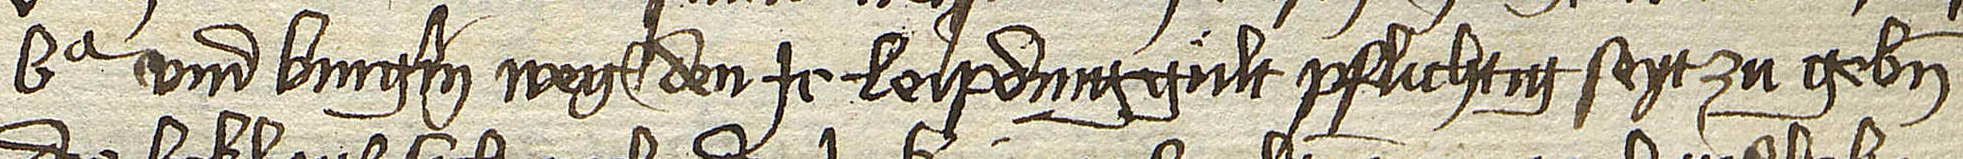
b* vnd burg*in weg* den Ir leipdinggült pflichtig ſeyt ʒu gebn*
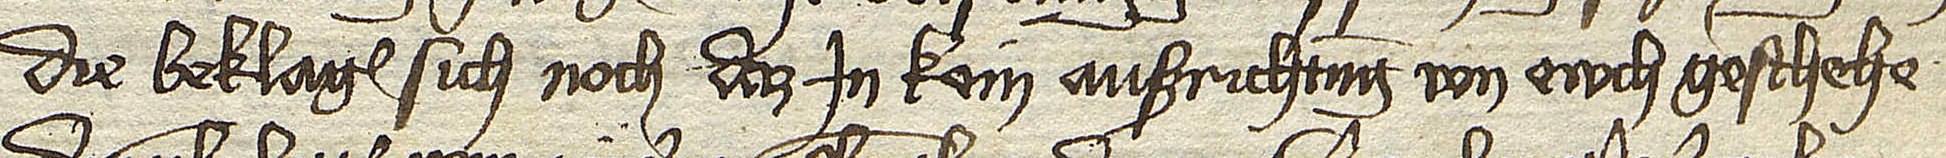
die beklag* ſich noch daʒ In kein auſʒrichtu*g von ewch geſchehe
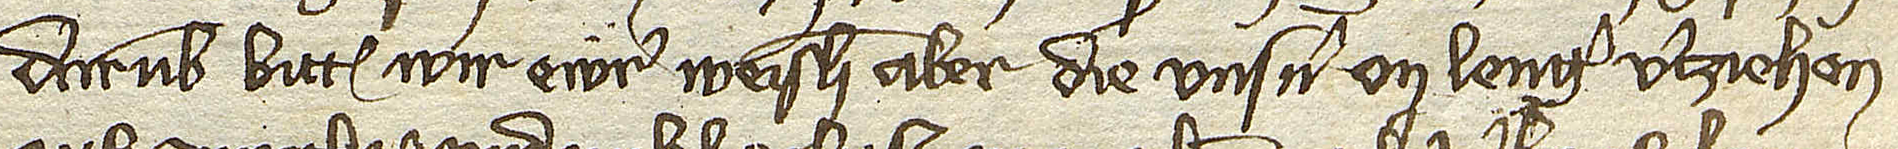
Darub* bitt* wir eẅr* weiſh* aber die vnſn* on leng* v*cʒiehen
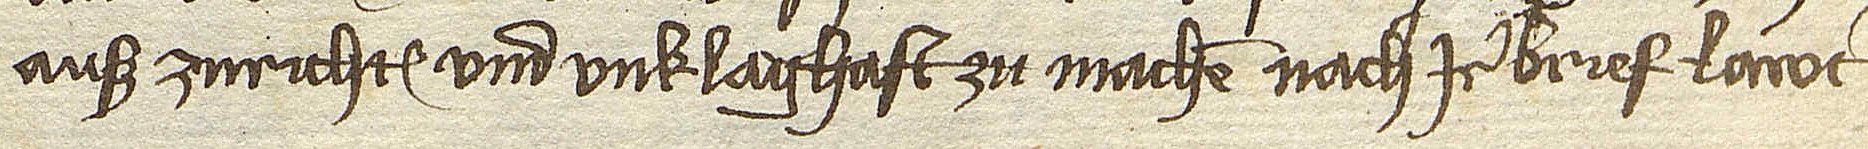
auſʒ ʒuricht* vnd vnklaghaft ʒu mache* nach Ir* brief lawt
